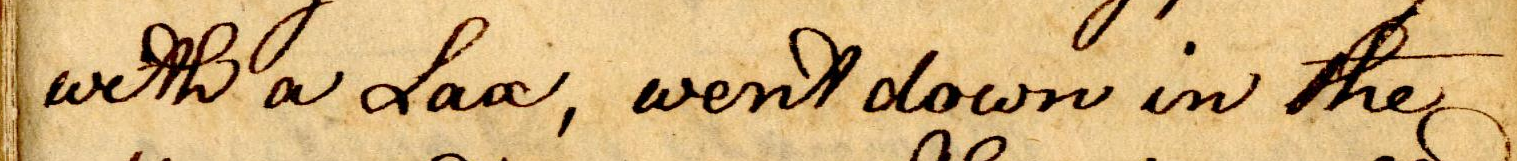with a Lax, went down in the
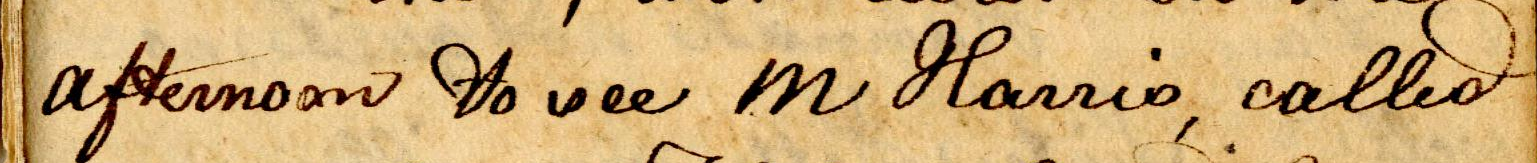Afternoon to see M Harris, called
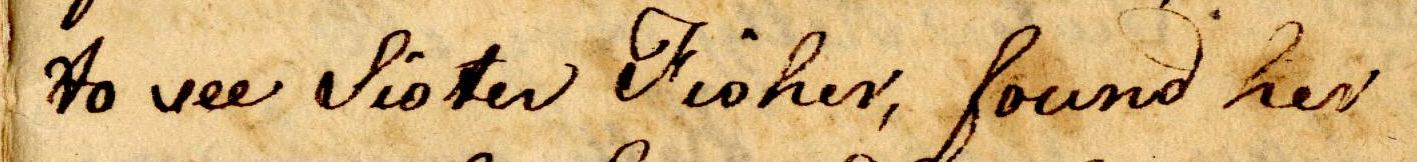to see Sister Fisher, found her
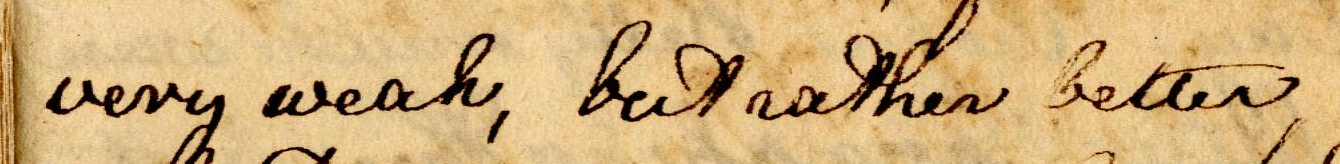very weak, but rather better,
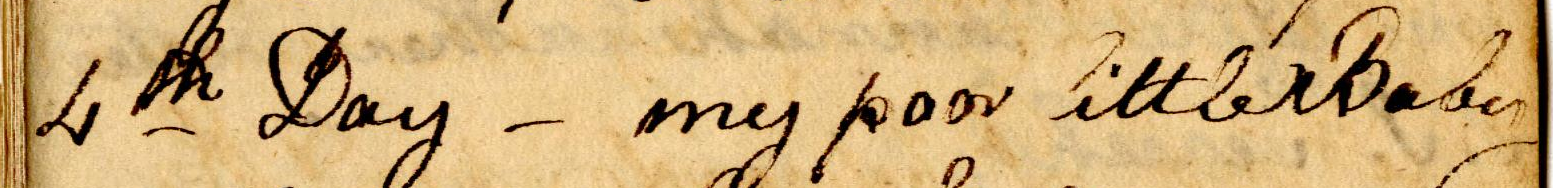4^th Day- my poor little Baby
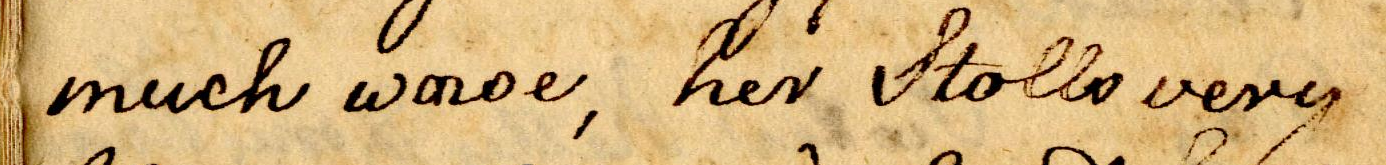much worse, her Stolls very
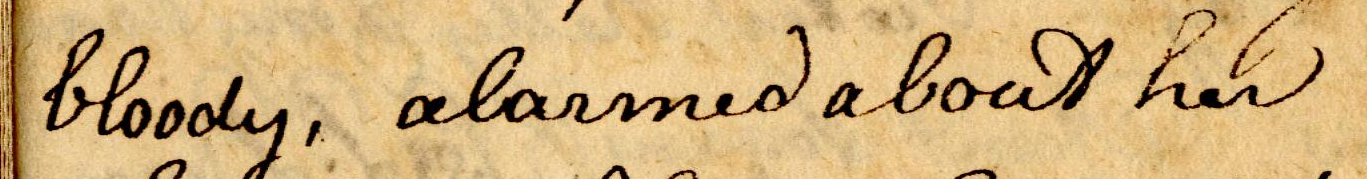bloody, alarmed about her
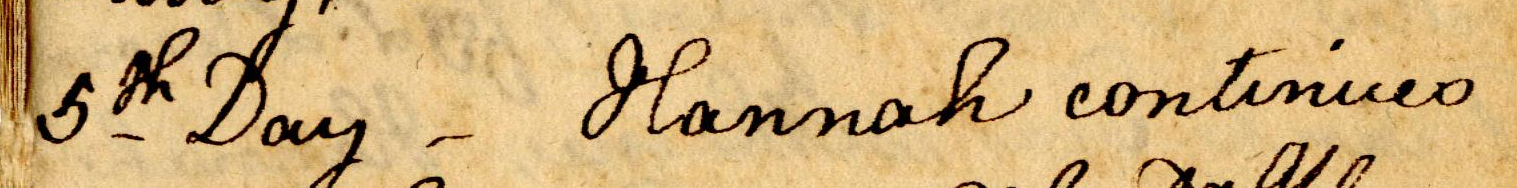5^th Day- Hannah continues
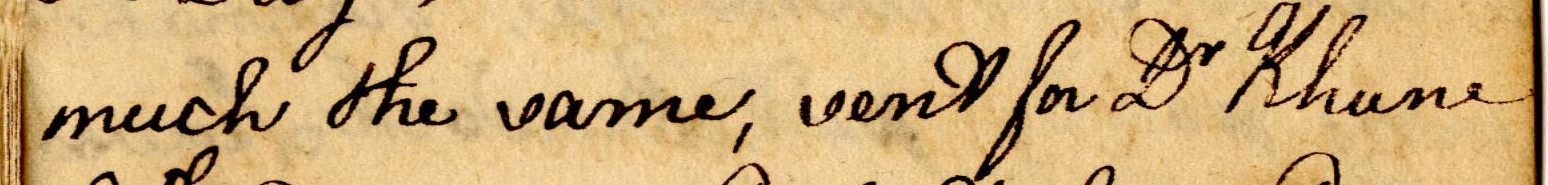much the same, sent for D^r Khune
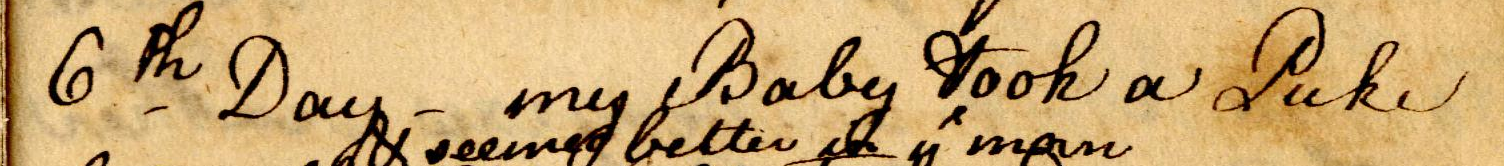6^th Day- my Baby took a Puke
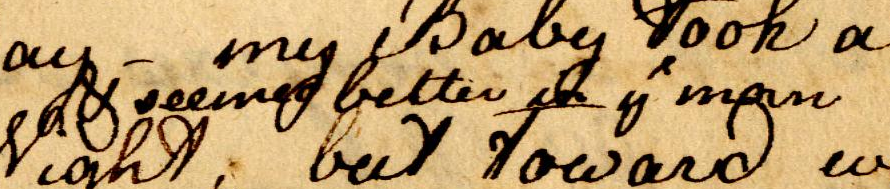& seemed better in y^e morn
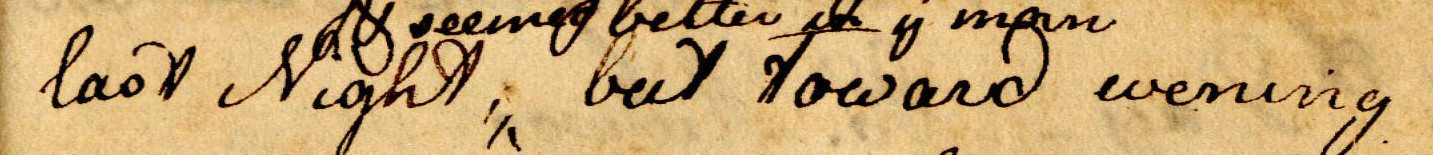last Night, ^ but toward evening
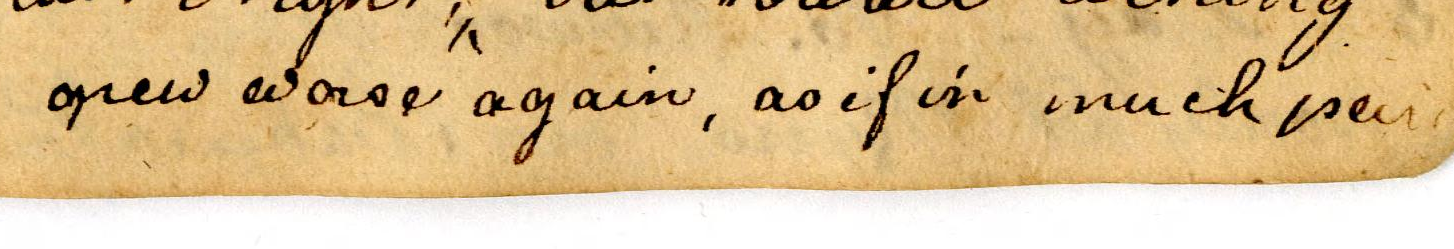grew worse again, as if in much pe
